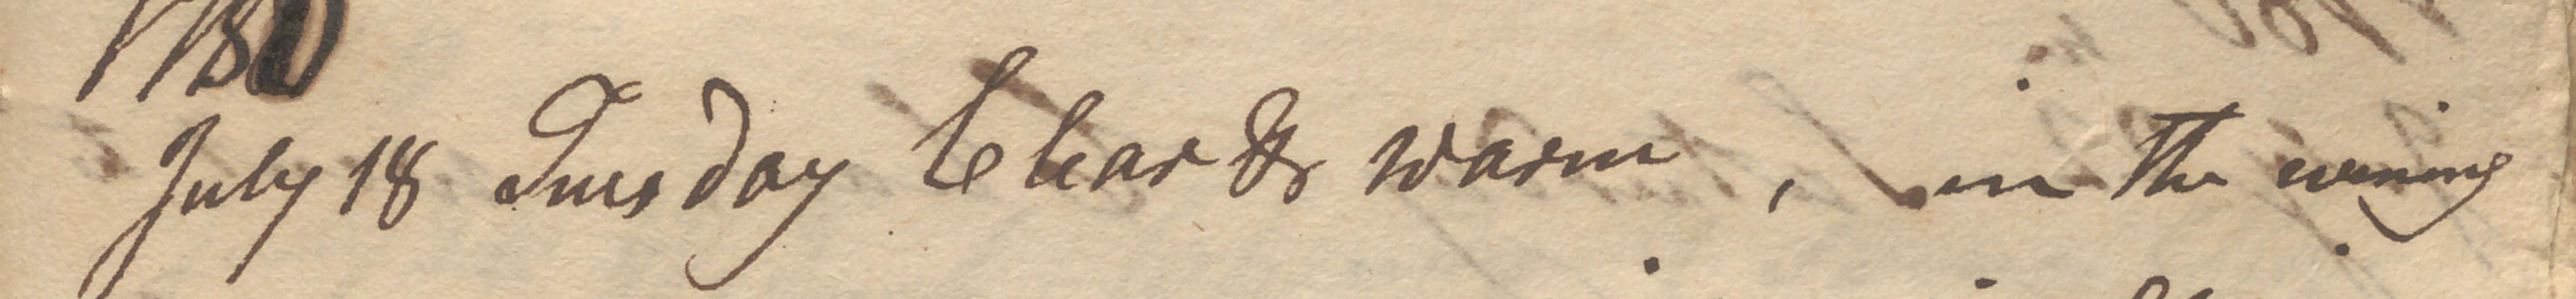July 18 Tuesday Clear & warm, in the evening
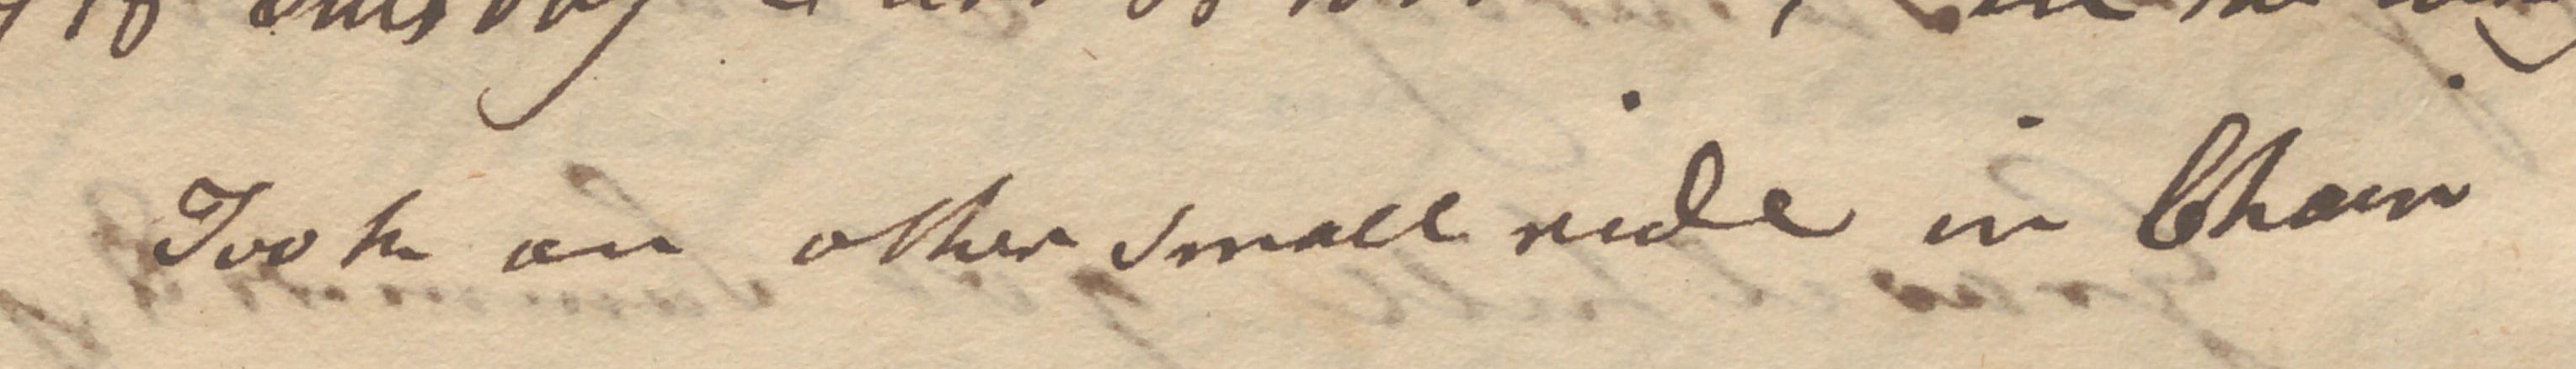Took an other small ride in Chair
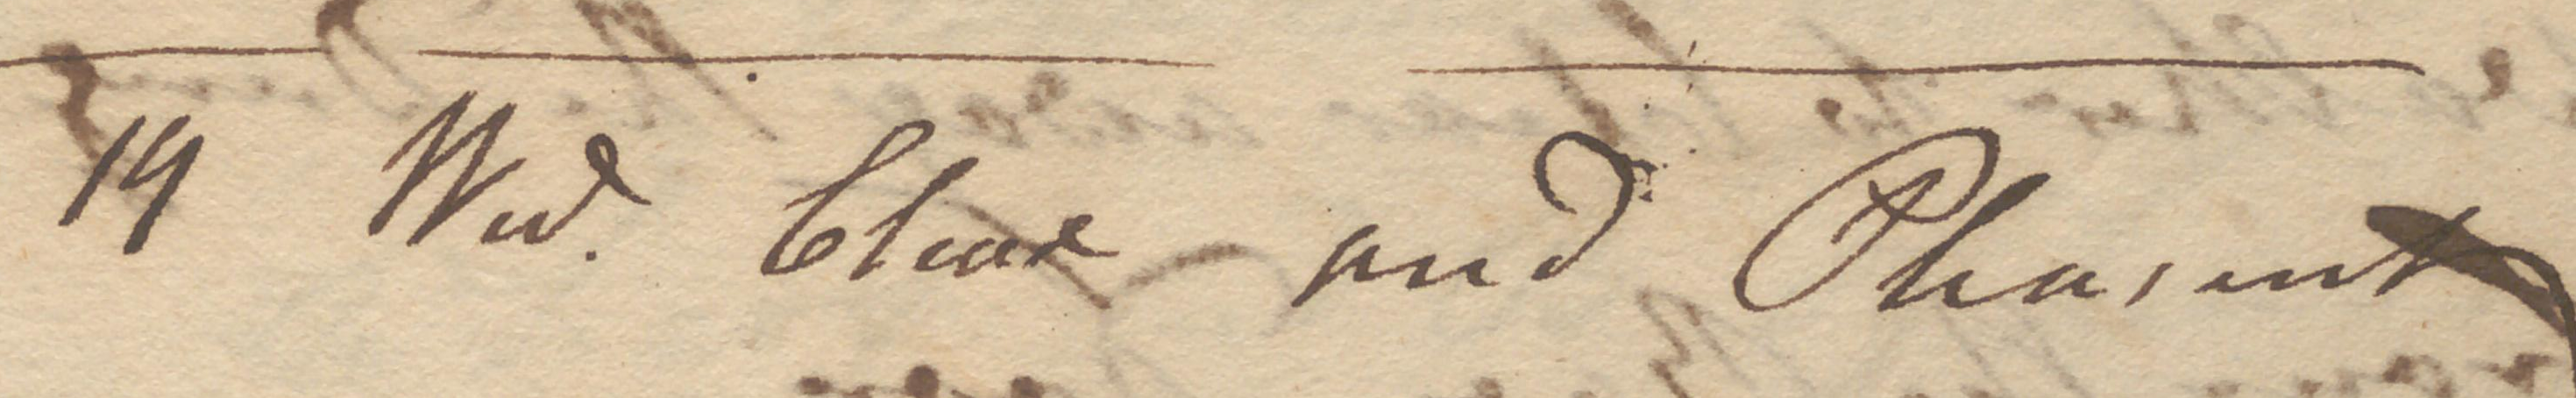19 Wed. Clear and Pleasent
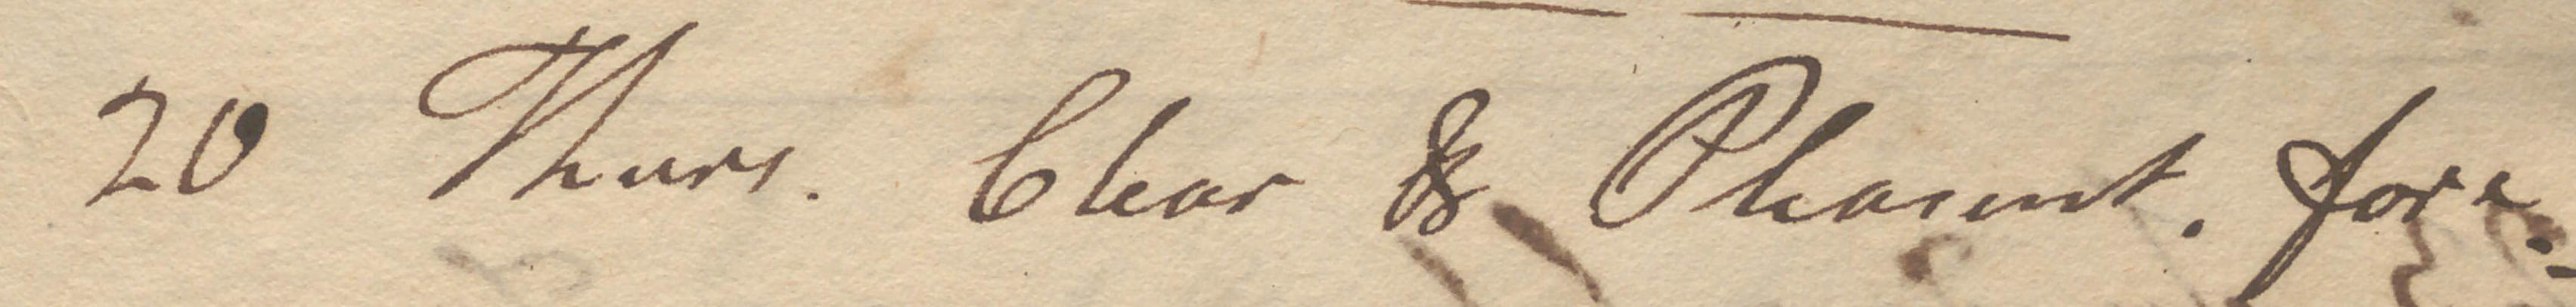20 Thurs. Clear & Pleasent. for
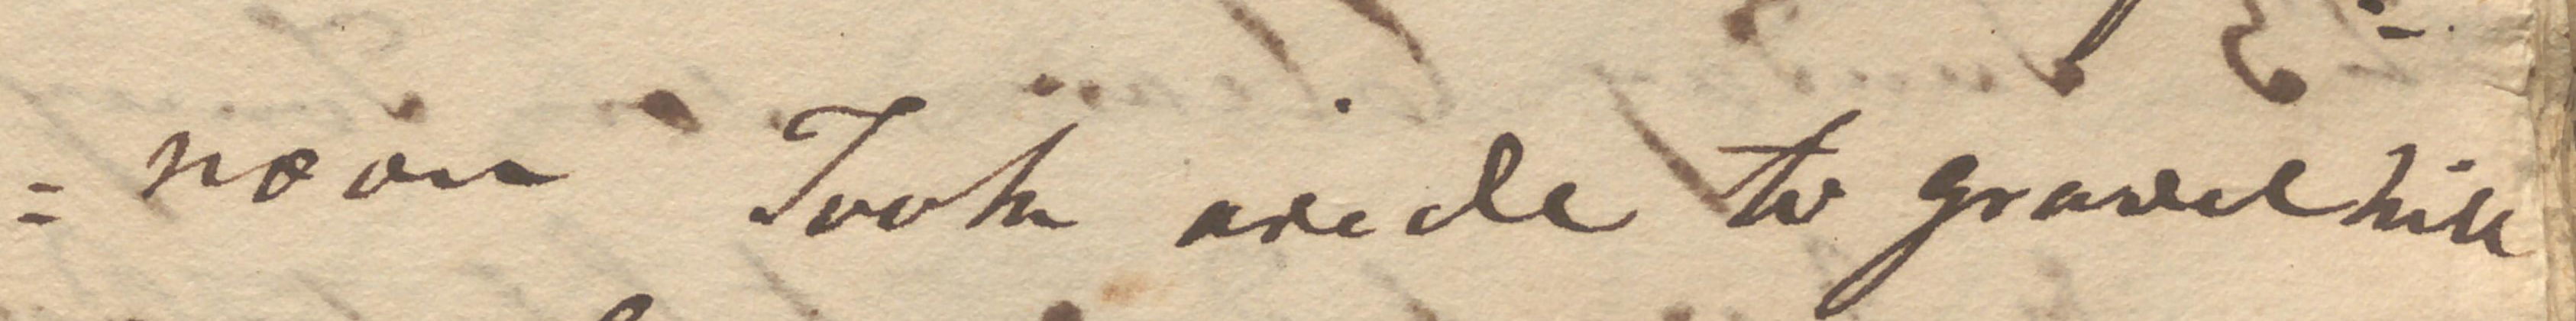noon Took a ride to gravel hill
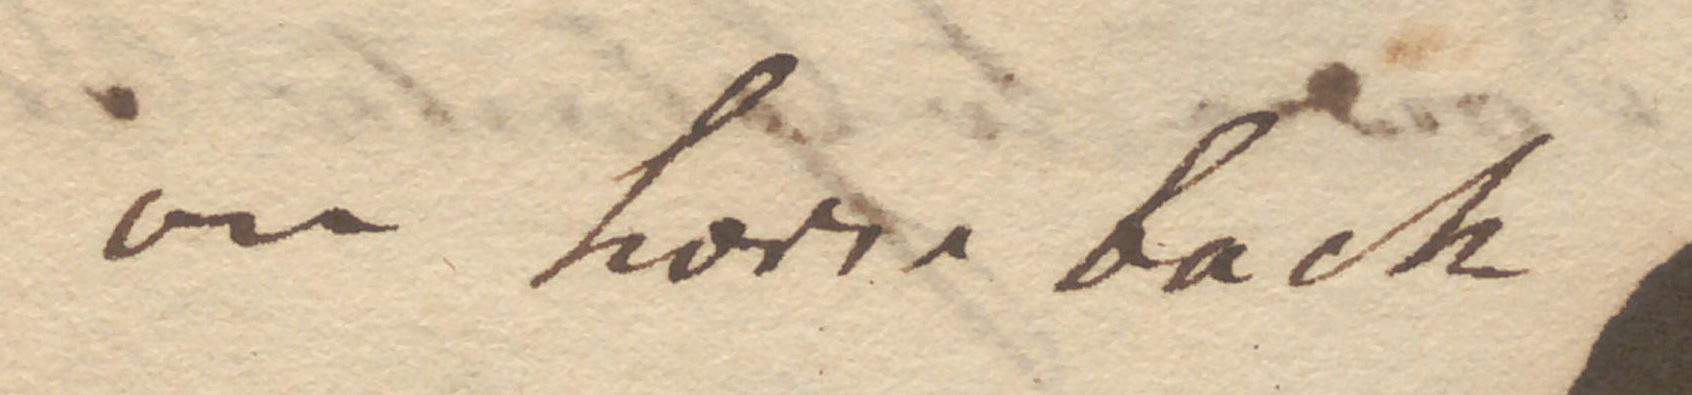on horse back
